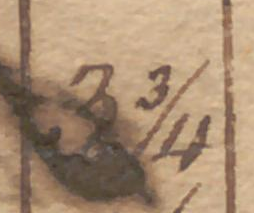3 3/4
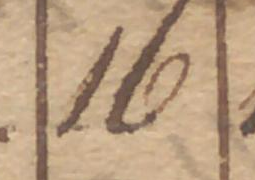16
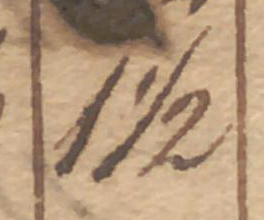1 1/2
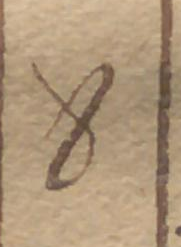8
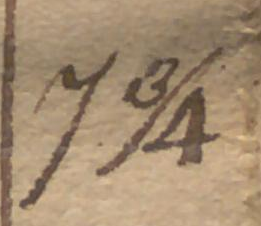7 3/4
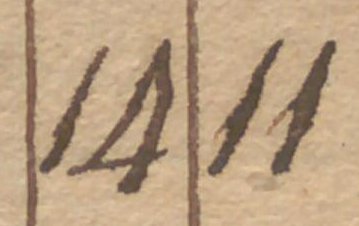14 11
